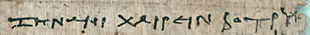ζηνωνι χαιρειν βοτρυιϲ
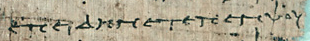επειδημετεπεμψου
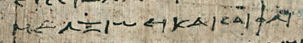μεαξιωεικαιϲοιφαι
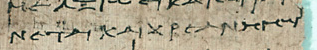νεταικαιχρεανημων
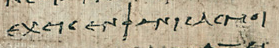εχειϲεμφανιϲαϲμοι
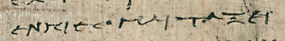ενηιεϲομαιταξει
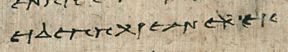ειδεμηχρεανεχειϲ
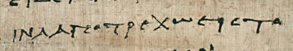ινααποτρεχωειϲτο
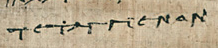τεταγμενον
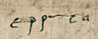ερρωϲο
